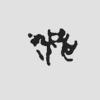神
